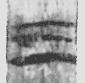三
